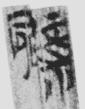{貝富示}（富）
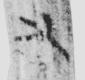又
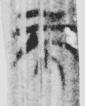天
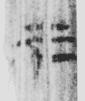下
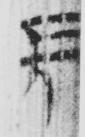長
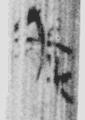年
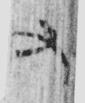又
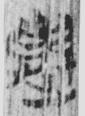○（譽）
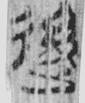後
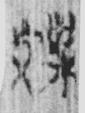殜（世）
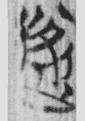遂
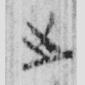之
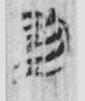則
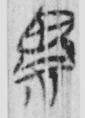{示鬼}（鬼）
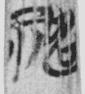神
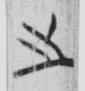之
